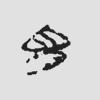胃
